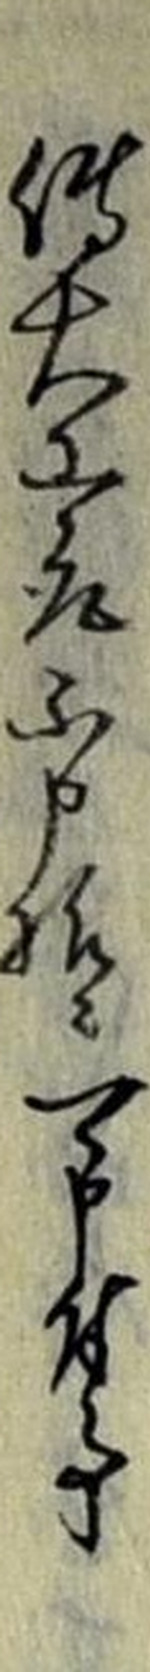伝大工取不申様ニ可申付事
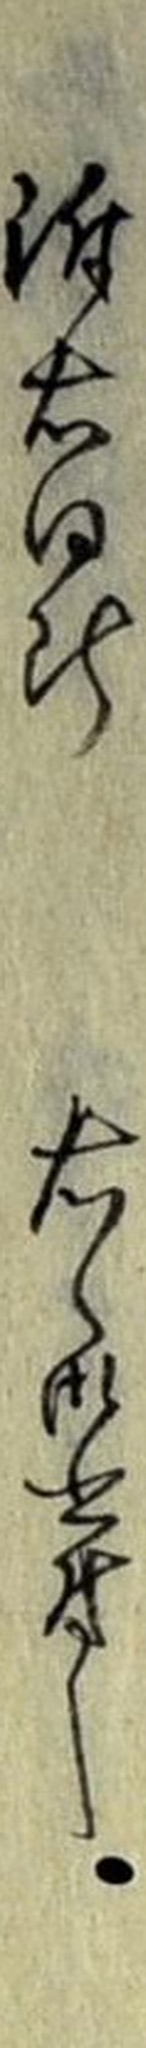附右同断右之御書付之
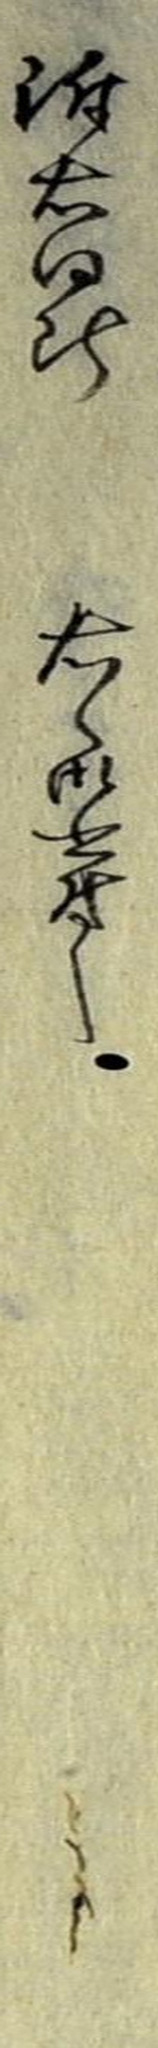附右同断右之御書付之
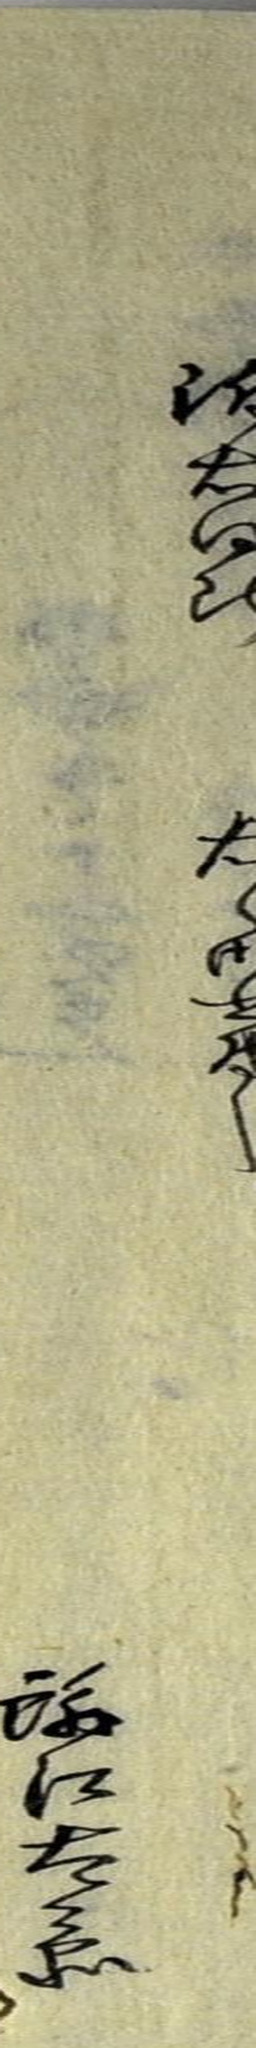蟹江太兵衛
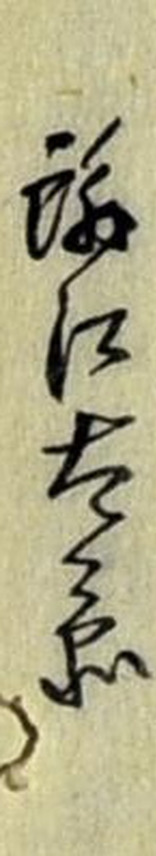蟹江太兵衛

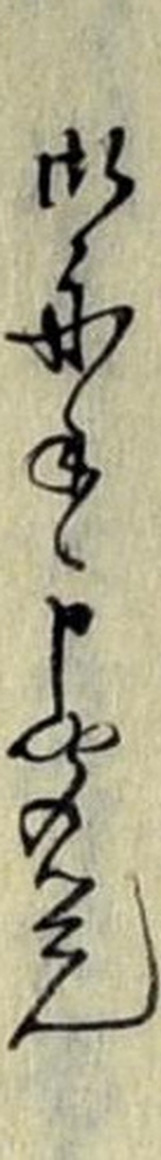御舟手へ申聞覚
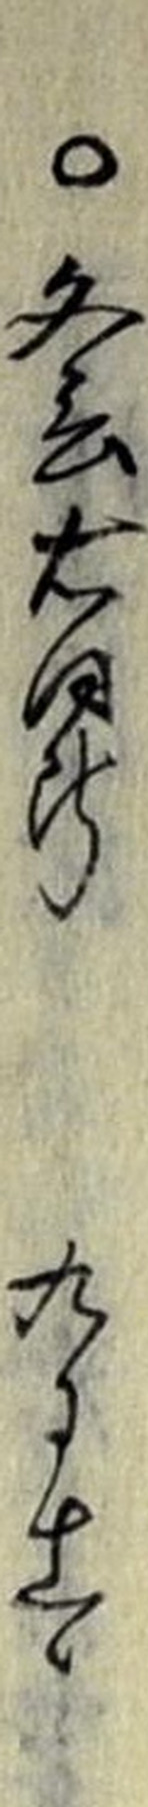〇文言右同断九月十一日
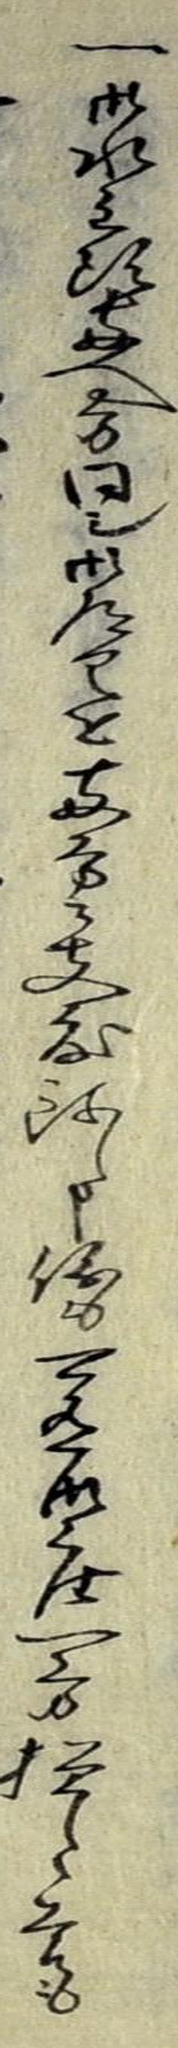一御水主頭両人方同シ御道具を両方ニ支度致し申儀も可有御座一方損し候節も
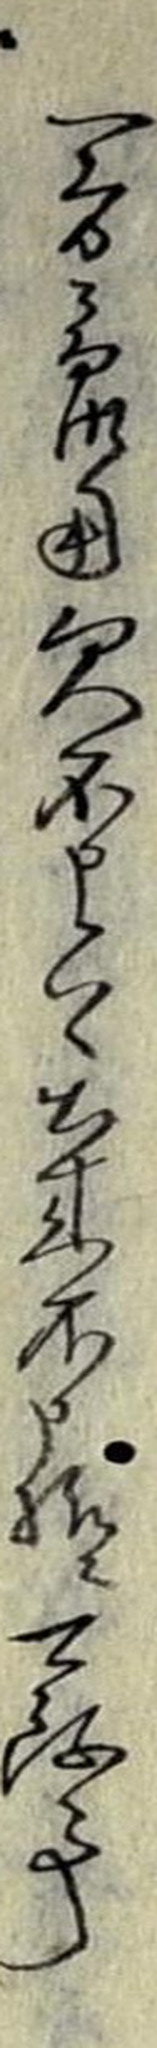一方ニ而御用欠不申候ハヽ出来不申様ニ可致事
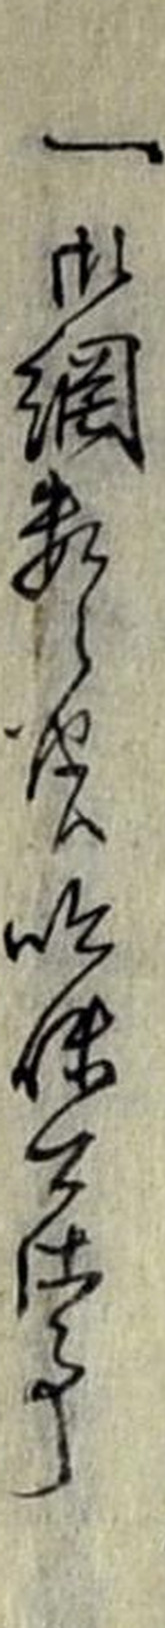一御網数之儀ハ吟味可仕事
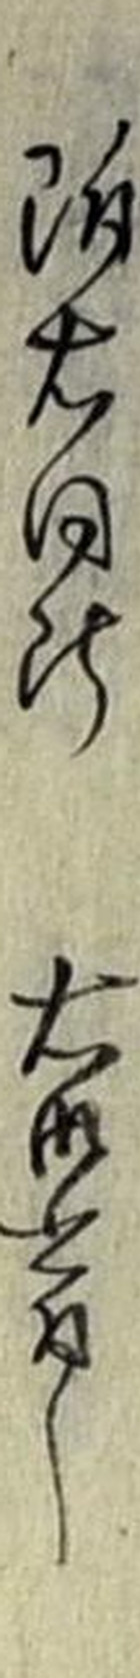附右同断右御書付之
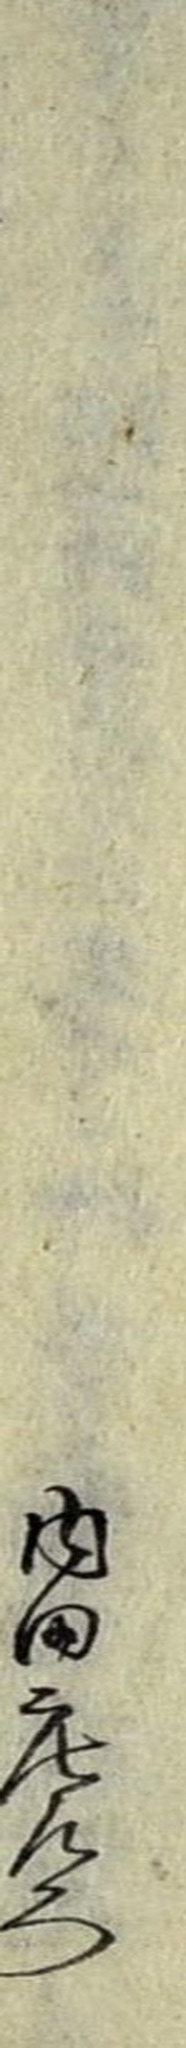内田庄左衛門
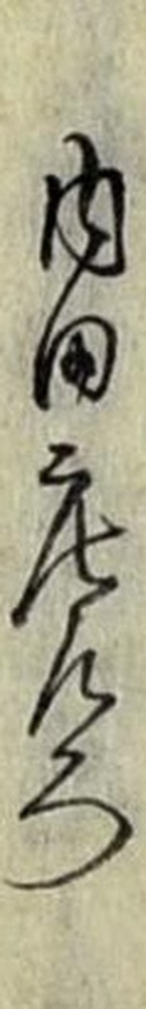内田庄左衛門
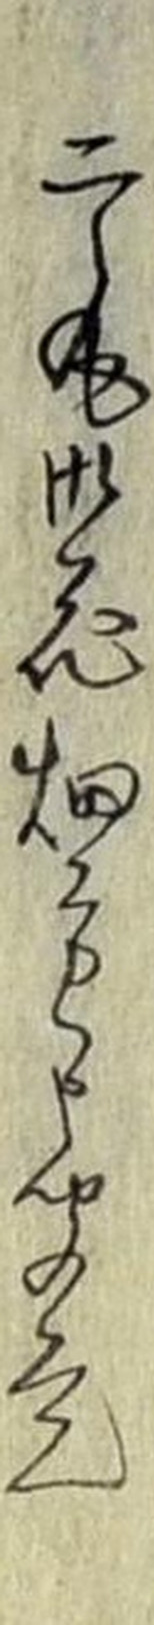二之丸御花畑方へ申聞覚
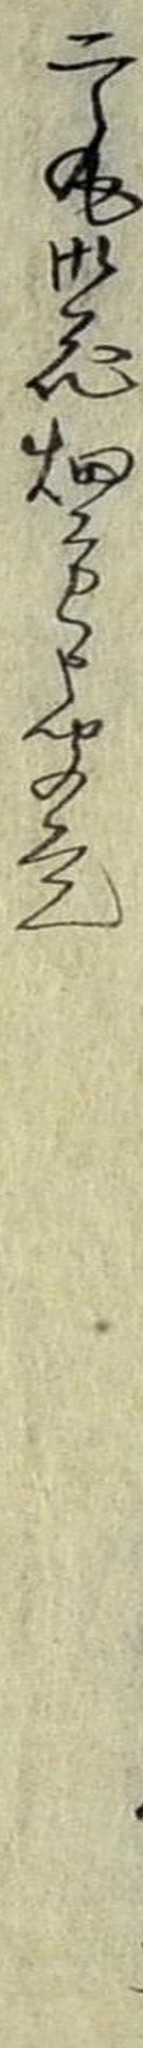二之丸御花畑方へ申聞覚
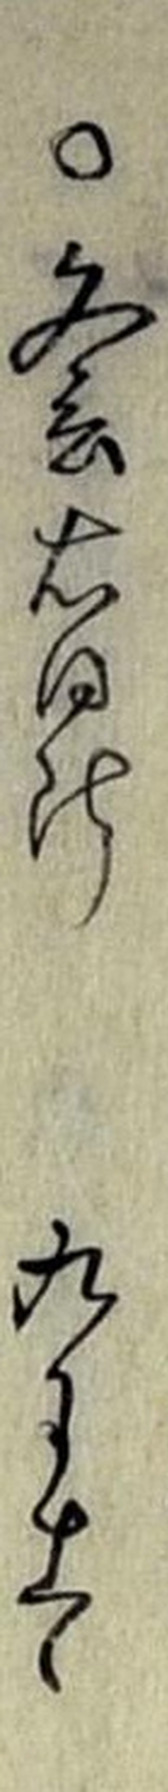〇文言右同断九月十一日
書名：命令之部 一
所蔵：福井県文書館 Fukui Prefectural Archives
